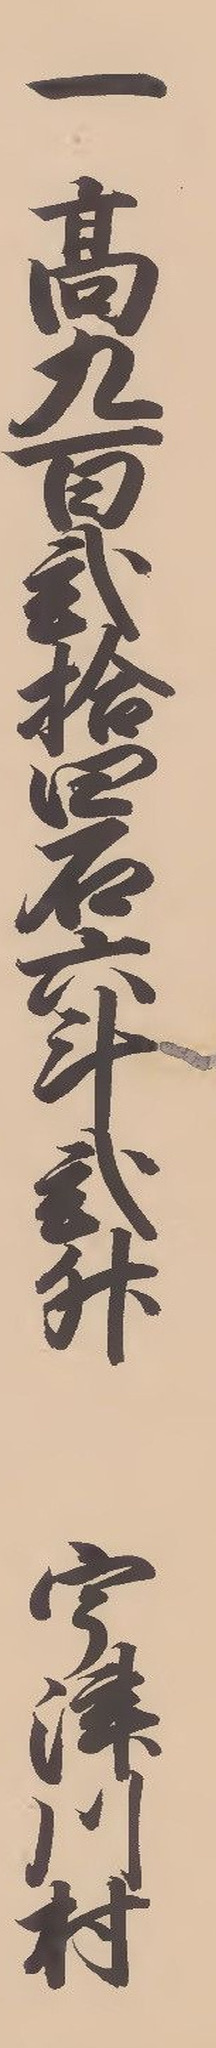一髙九百弐拾四石六斗弐升宇津川村
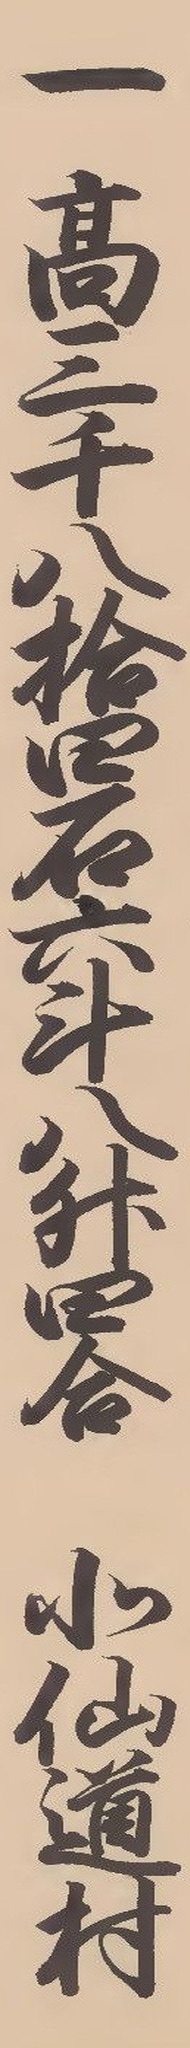一髙三千八拾四石六斗八升四合北仙道村
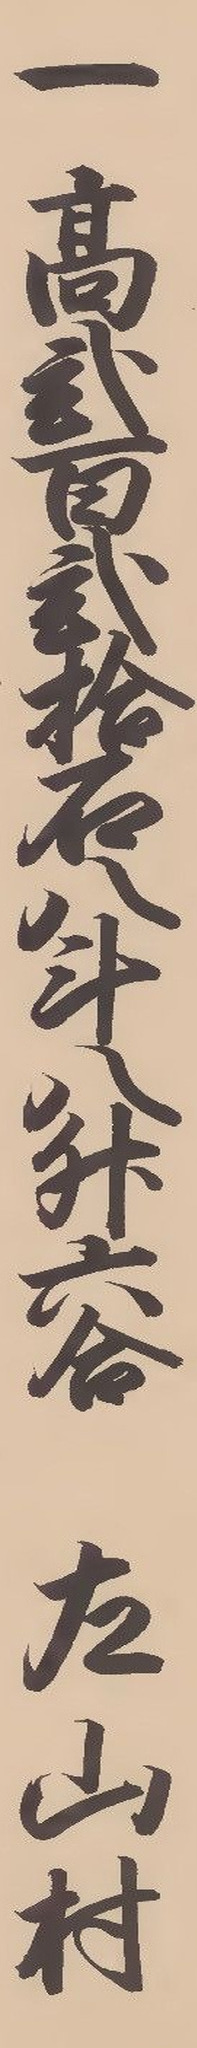一髙弐百弐拾石八斗八升六合左山村
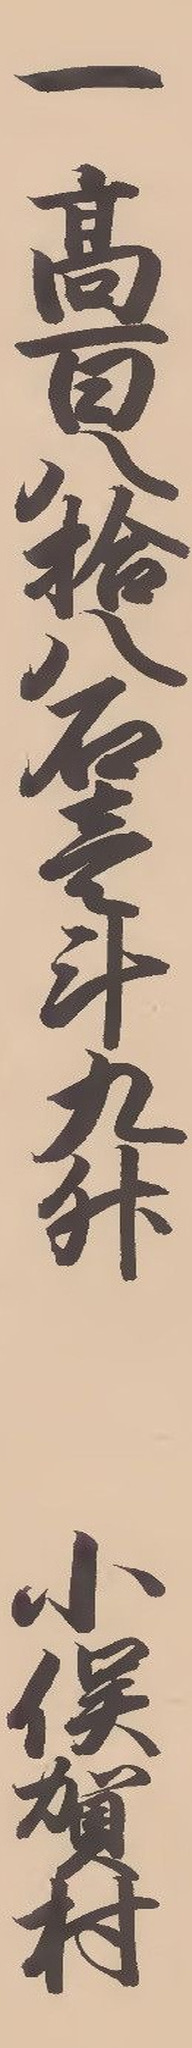一髙百八拾八石壱斗九升小俣賀村
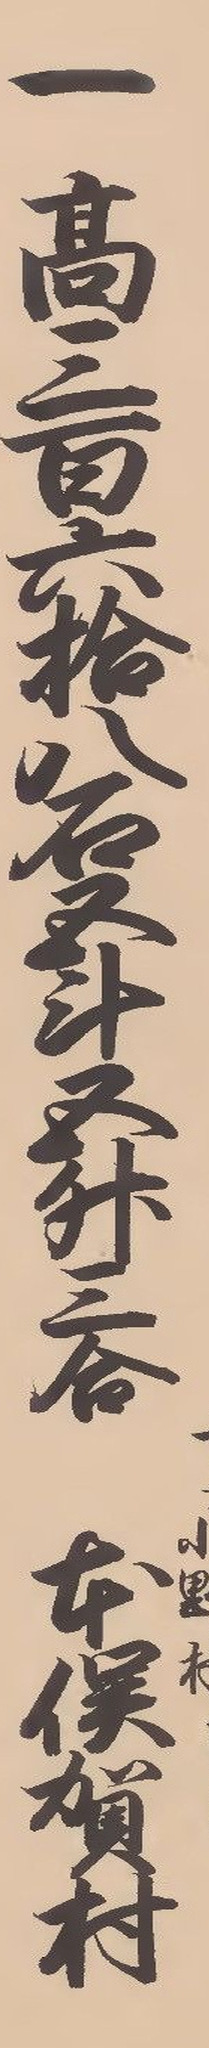一髙三百六拾八石五斗五升三合本俣賀村
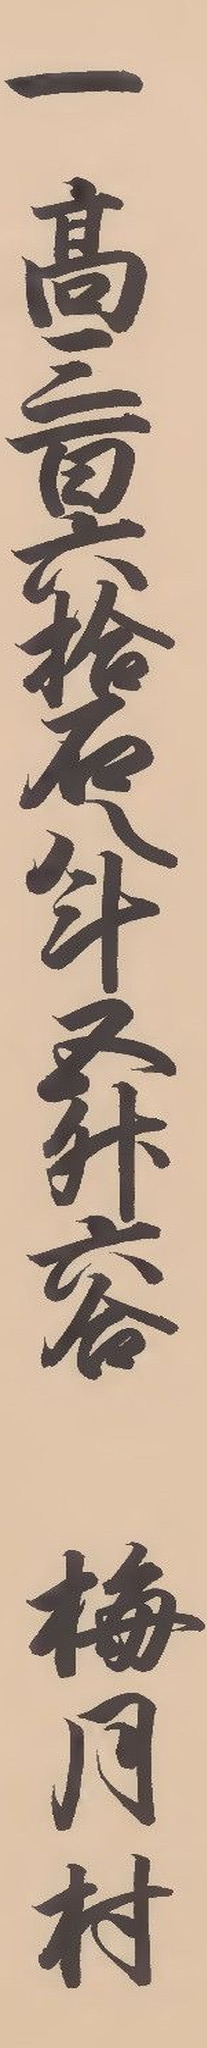一髙三百六拾石八斗五升六合梅月村
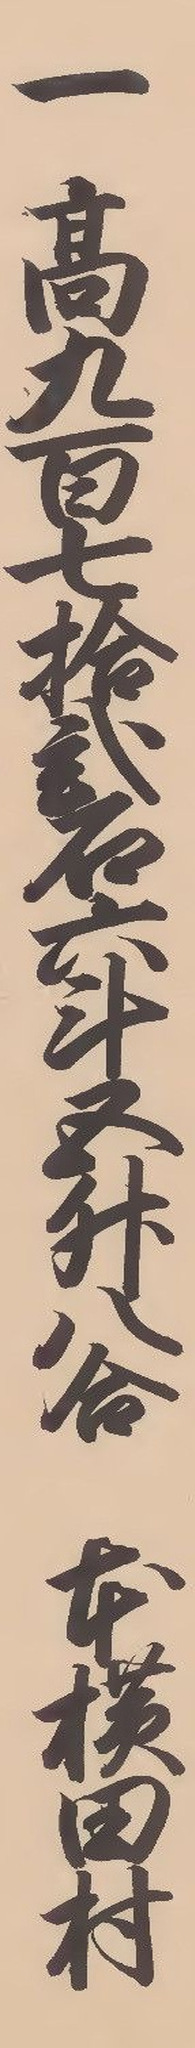一髙九百七拾弐石六斗五升八合本横田村
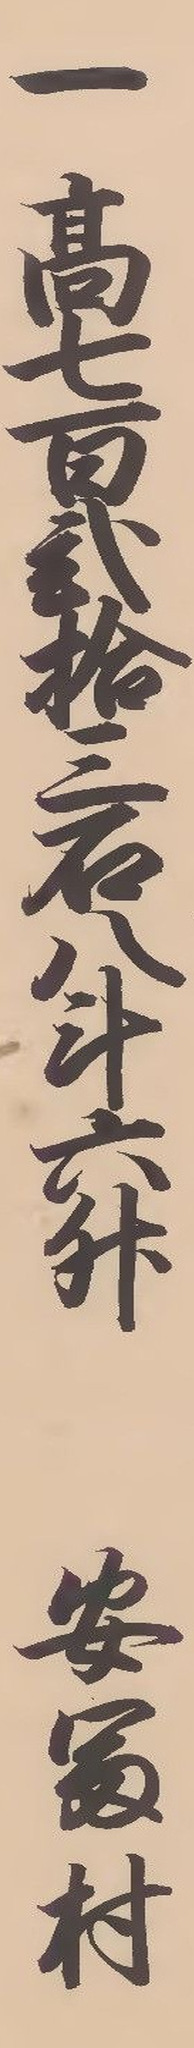一髙七百弐拾三石八斗六升安冨村

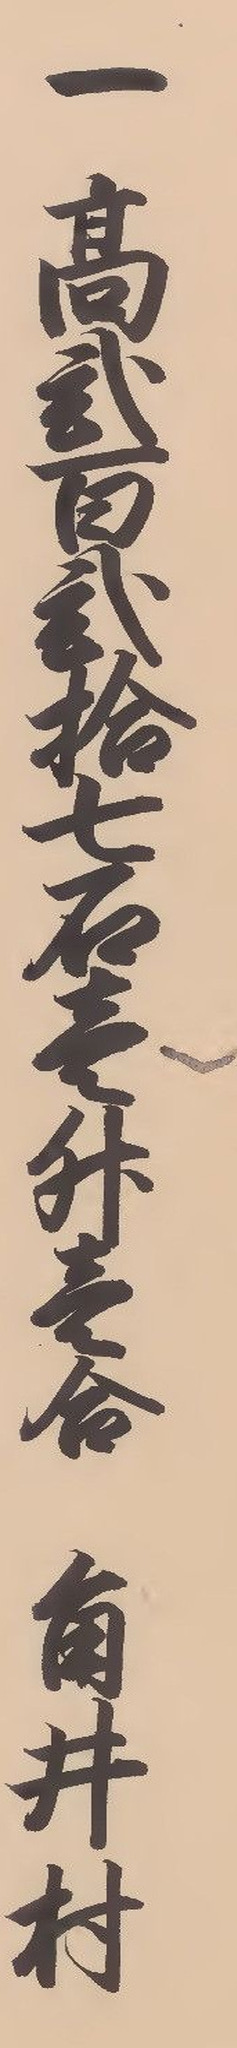一髙弐百弐拾七石壱升壱合角井村
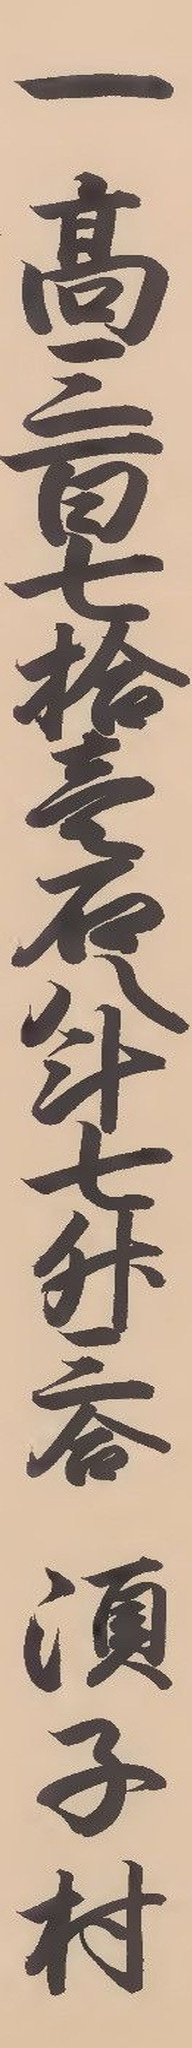一髙三百七拾壱石八斗七升三合須子村
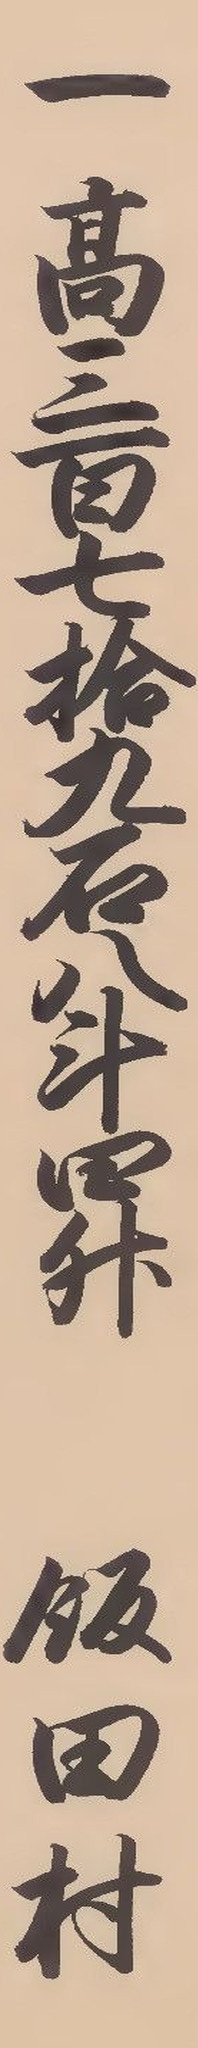一髙三百七拾九石八斗四升飯田村
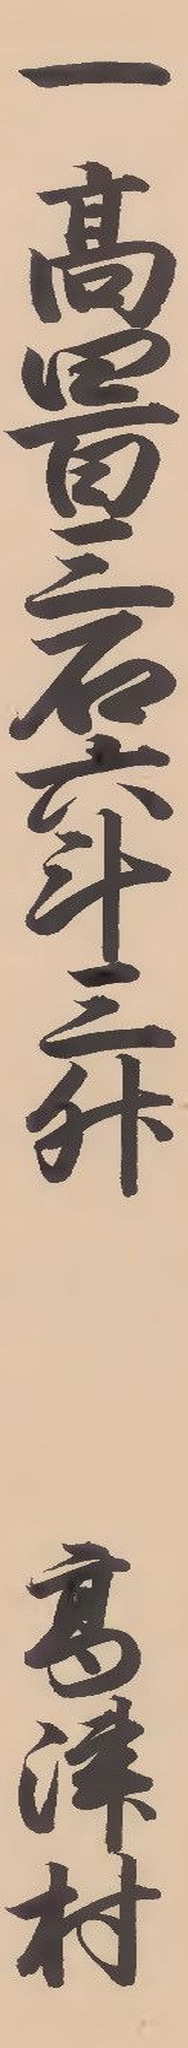一高四百三石六斗三升髙津村
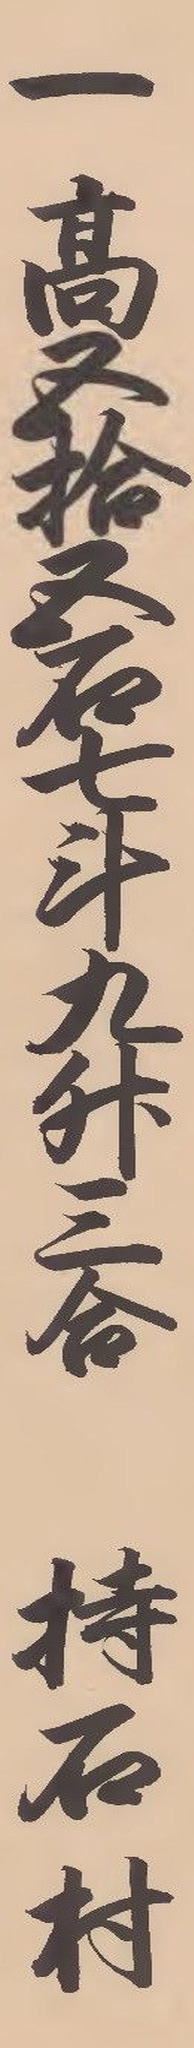一髙五拾五石七斗九升三合持石村
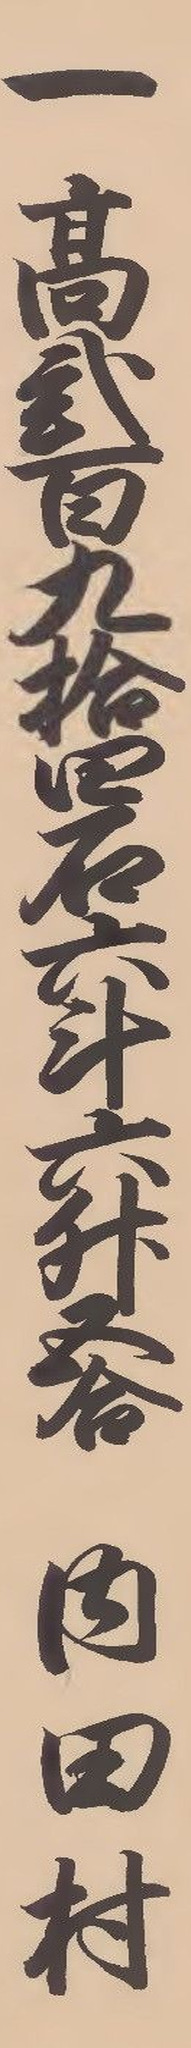一髙弐百九拾四石六斗六升五合内田村
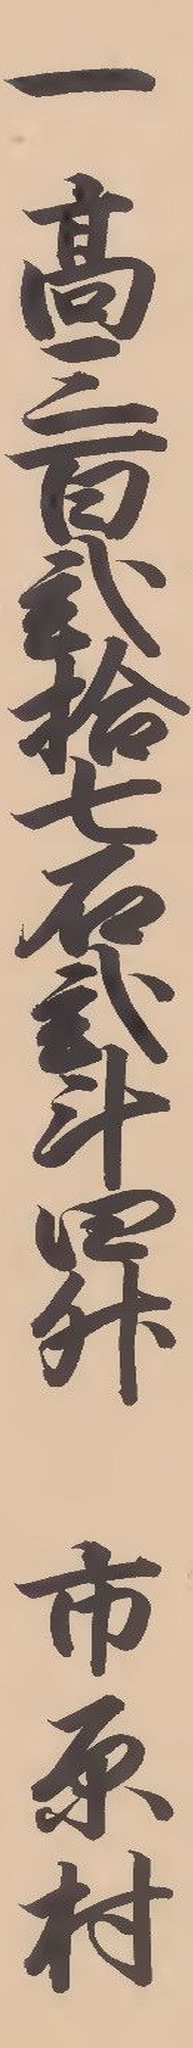一髙三百弐拾七石弐斗四升市原村
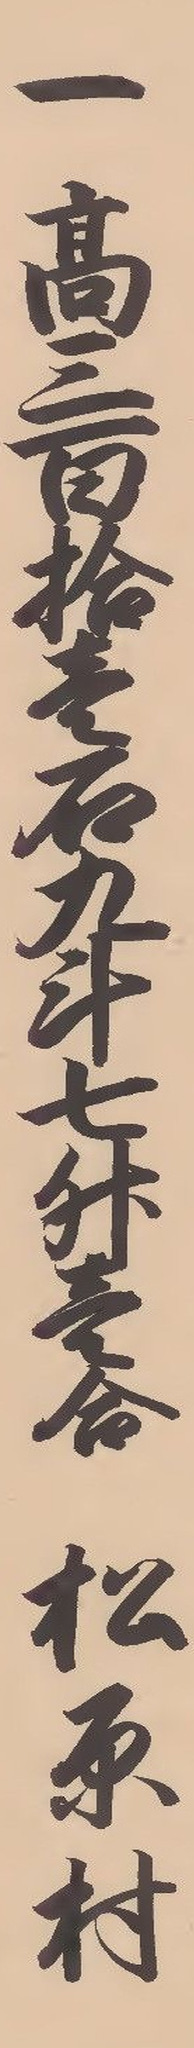一髙三百拾壱石九斗七升壱合松原村
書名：石見国郷帳
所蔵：国立公文書館 National Archives of Japan
